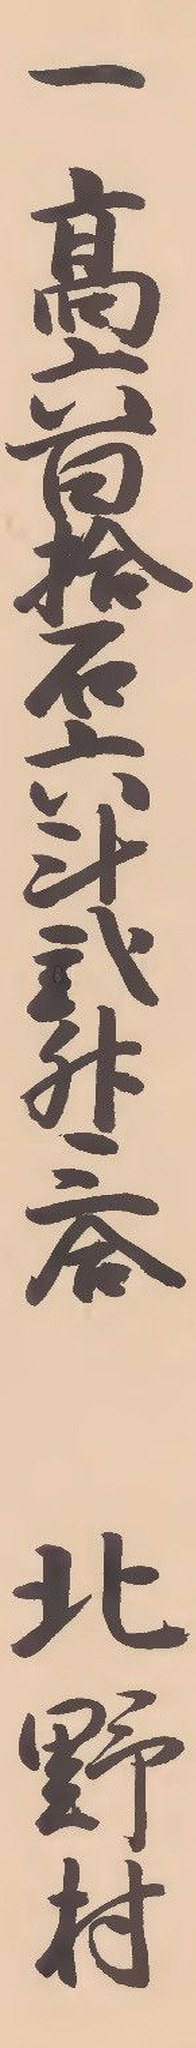一高六百拾石六斗弐升三合北野村
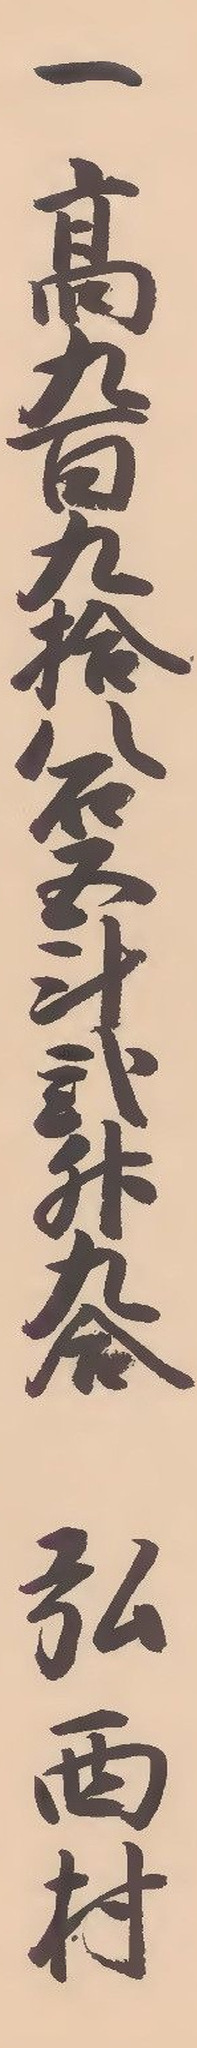一高九百九拾八石五斗弐升九合弘西村

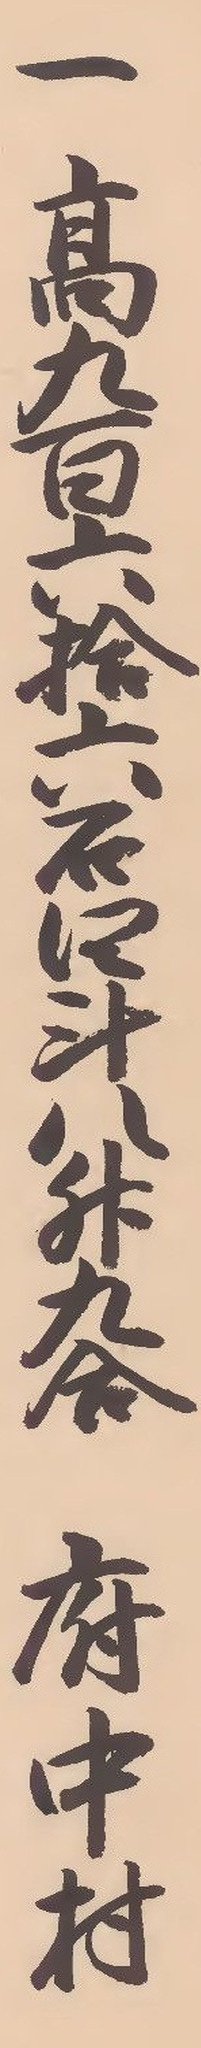一高九百六拾六石四斗八升九合府中村
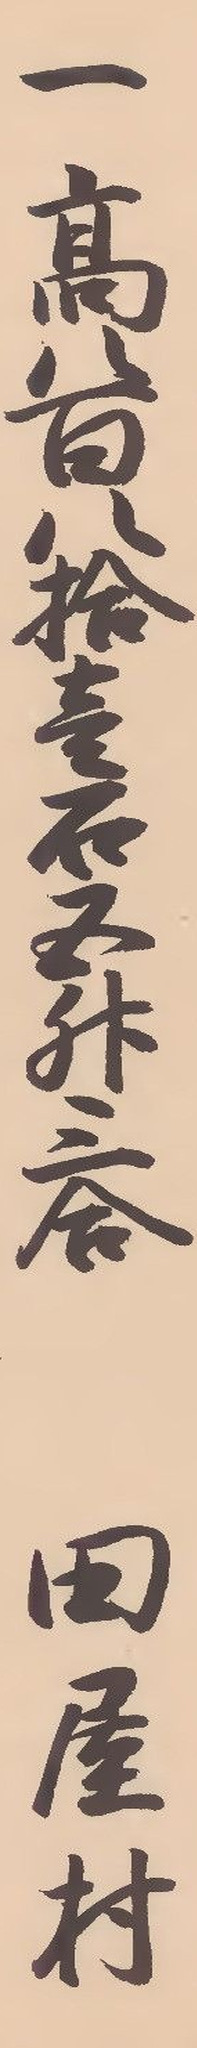一高八百八拾壱石五升三合田屋村
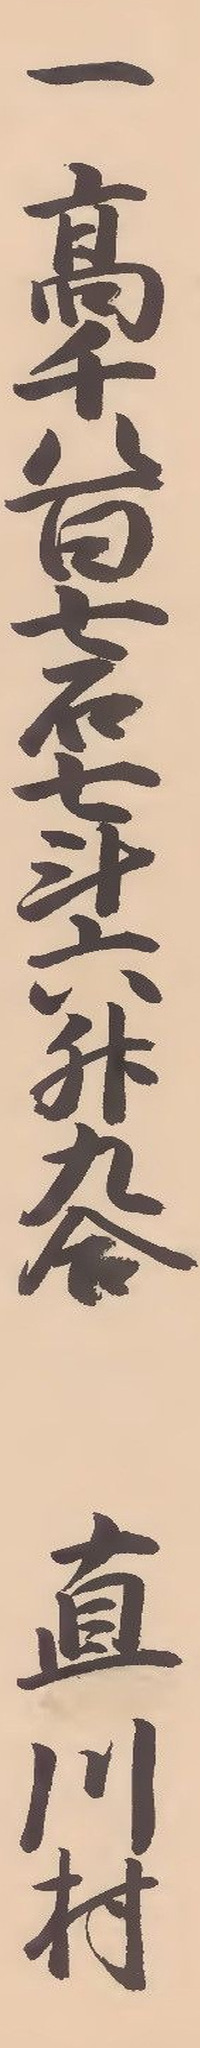一高千八百七石七斗六升九合直川村
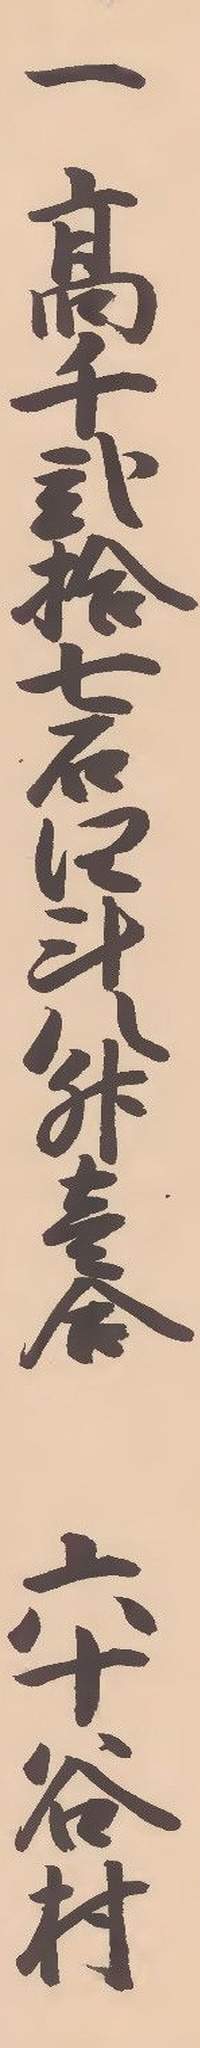一高千弐拾七石四斗八升壱合六十谷村
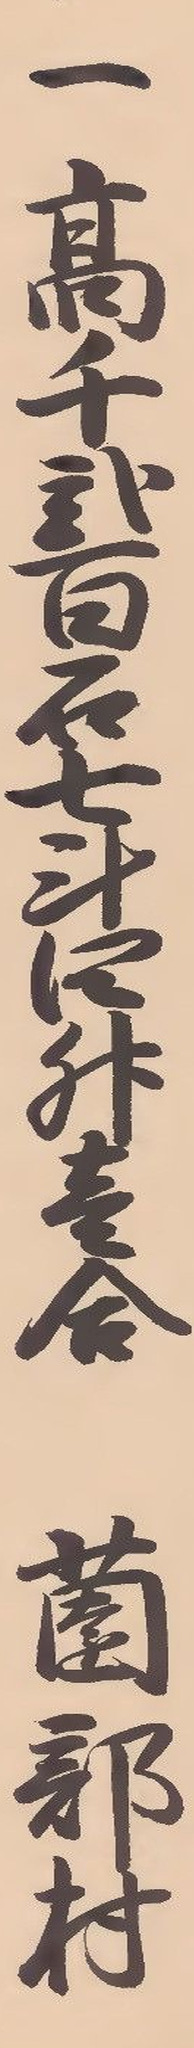一高千弐百石七斗四升壱合園部村
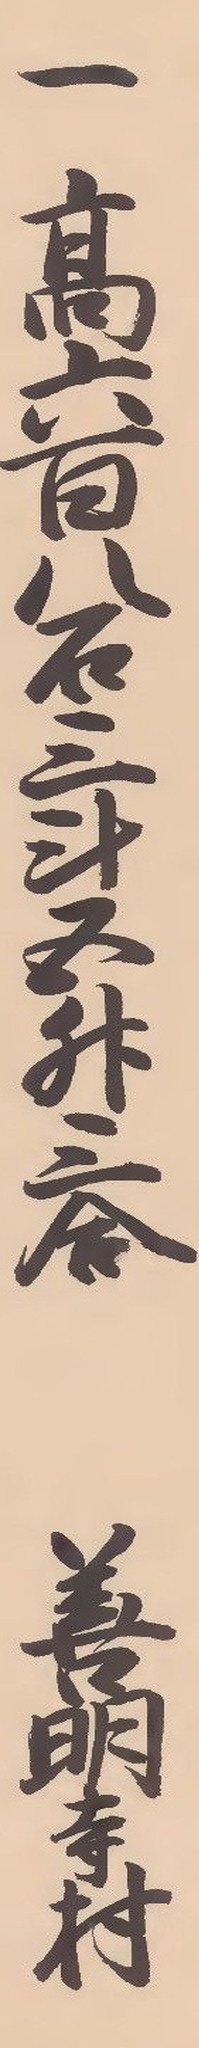一高六百八石三斗五升三合善明寺村
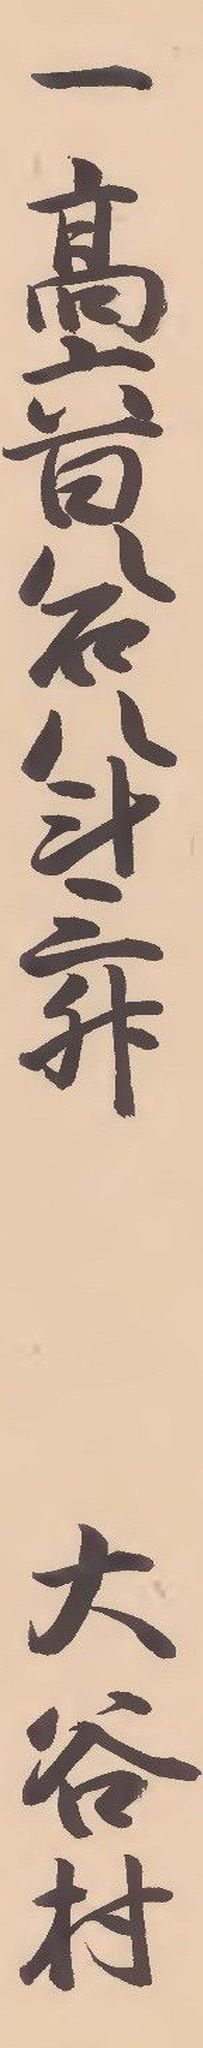一高六百八石八斗三升大谷村
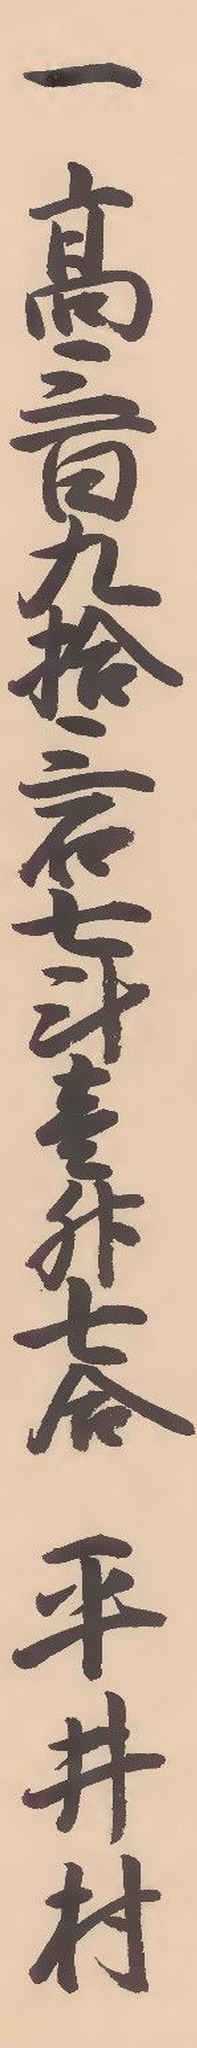一高三百九拾三石七斗壱升七合平井村

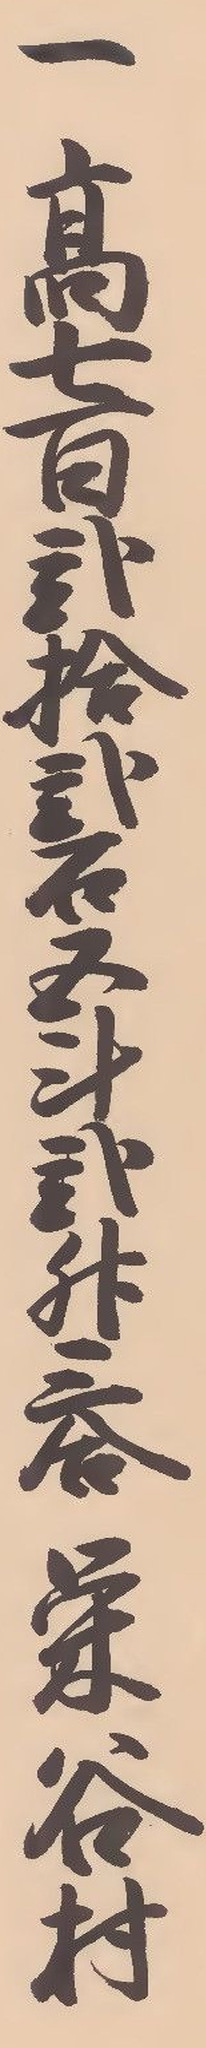一高七百弐拾弐石五斗弐升三合栄谷村
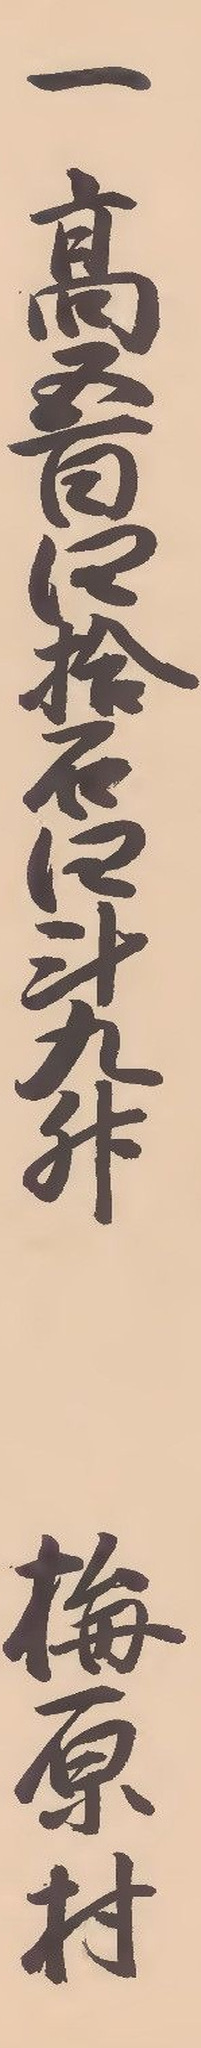一高五百四拾石四斗九升梅原村
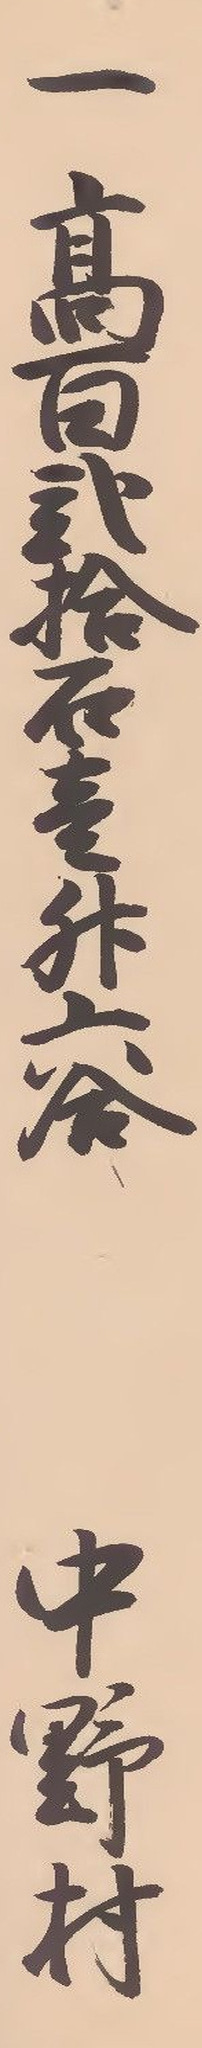一高百弐拾石壱升六合中野村
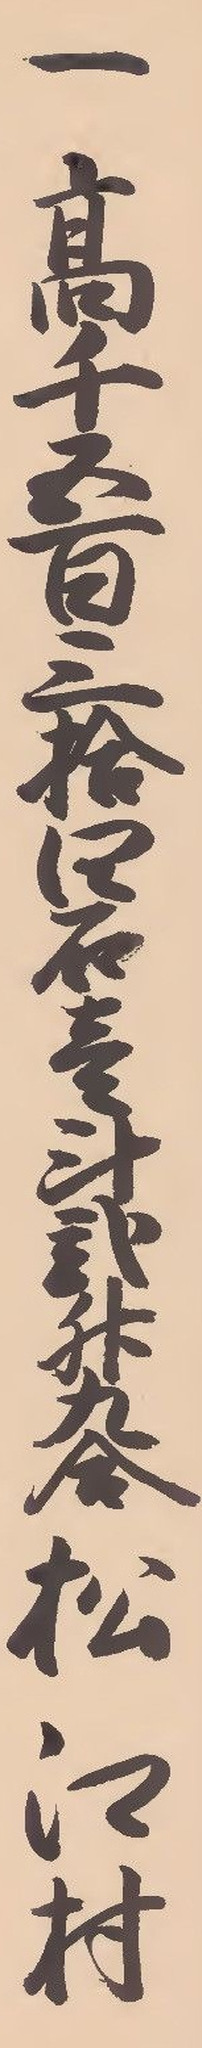一高千五百三拾四石壱斗弐升九合松江村
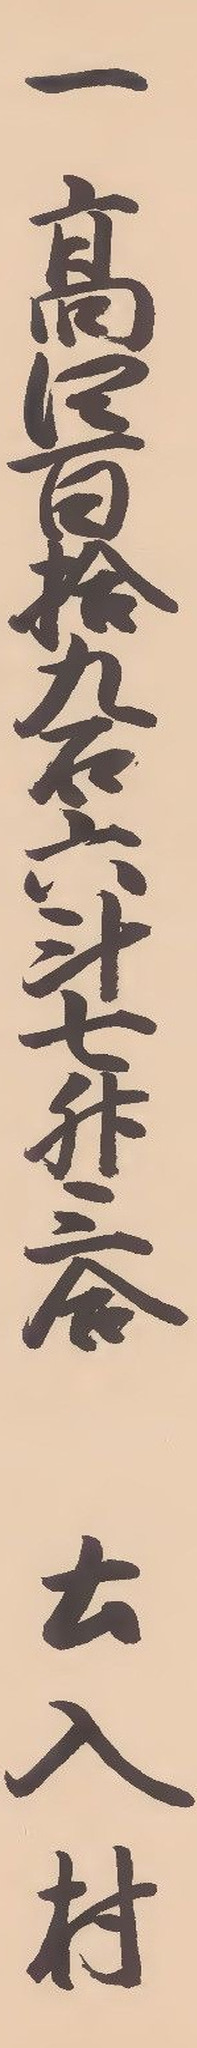一高四百拾九石六斗七升三合土入村
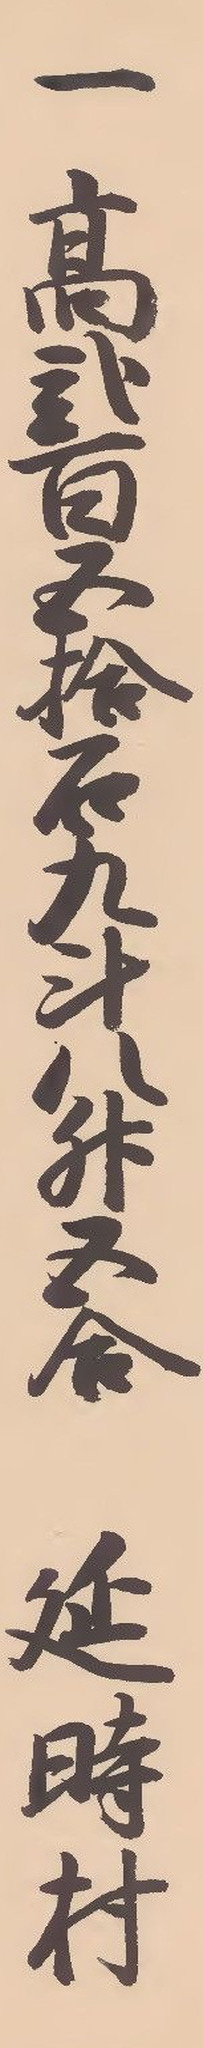一高弐百五拾石九斗八升五合延時村
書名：紀伊国郷帳
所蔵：国立公文書館 National Archives of Japan
